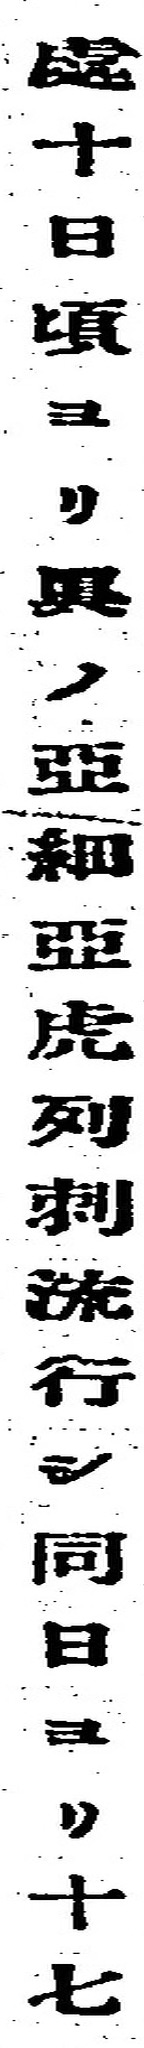処十日頃ヨリ真ノ亜細亜虎列刺流行シ同日ヨリ十七
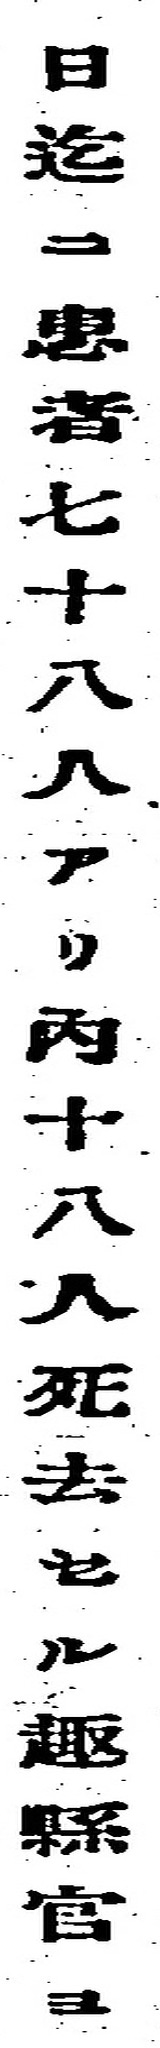日迄ニ患者七十八人アリ内十八人死去セル趣県官ヨ
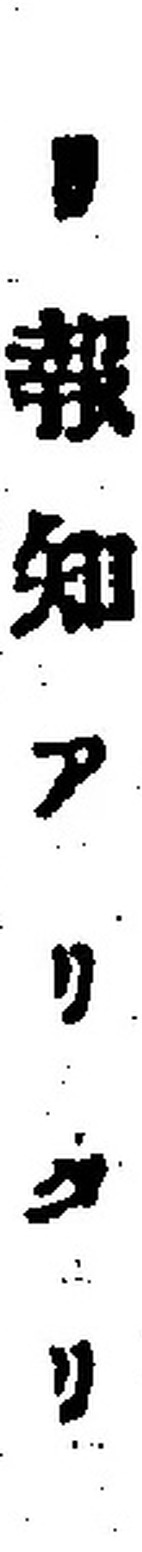リ報知アリタリ
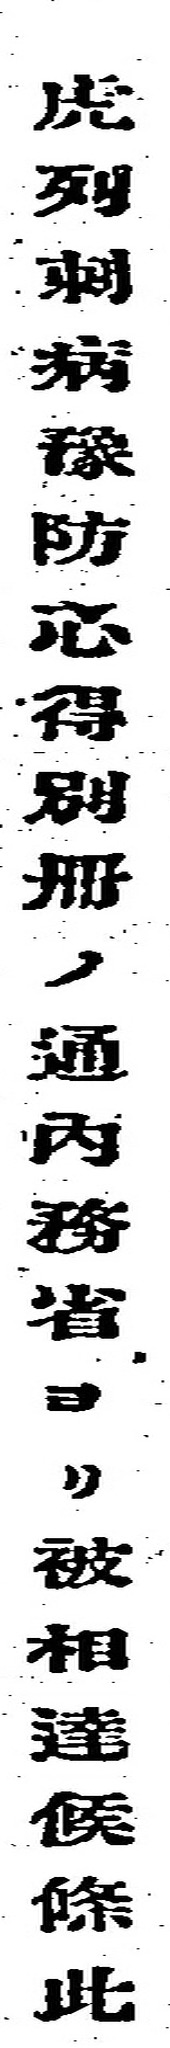虎列刺病予防心得別冊ノ通内務省ヨリ被相達候条此
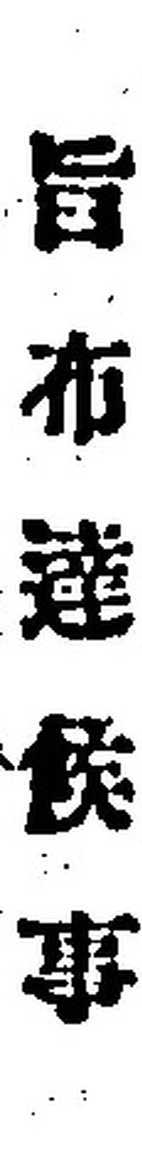旨布達候事
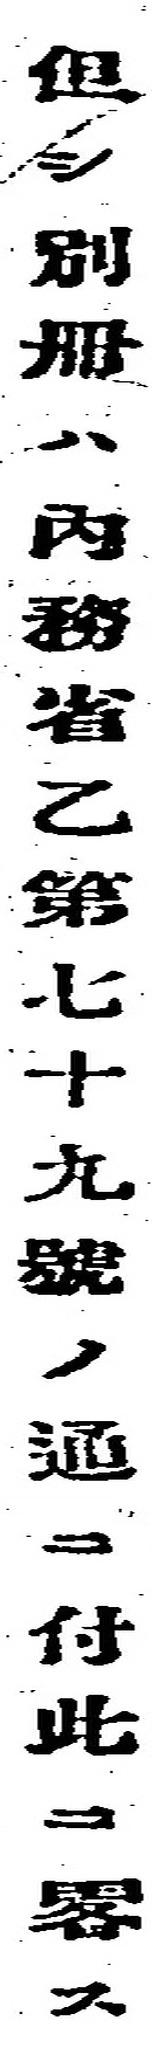但シ別冊ハ内務省乙第七十九号ノ通ニ付此ニ略ス
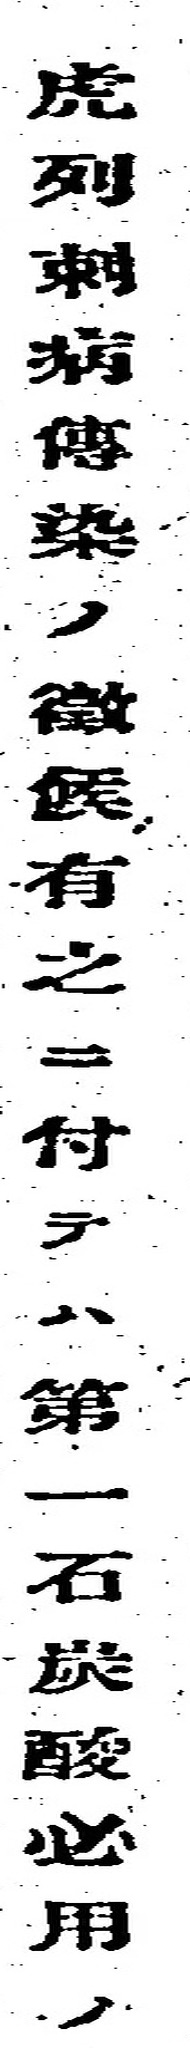虎列刺病伝染ノ徴候有之ニ付テハ第一石炭酸必用ノ

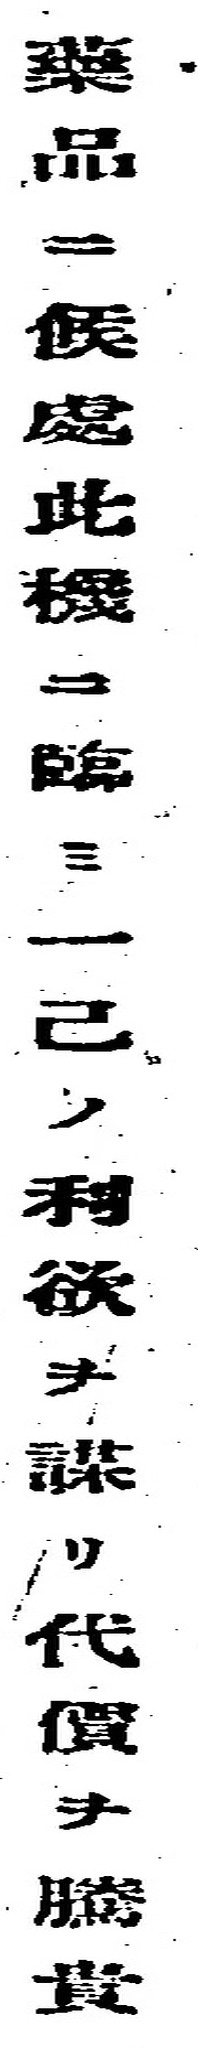薬品ニ候処此機ニ臨ミ一己ノ利欲ヲ謀リ代価を騰貴
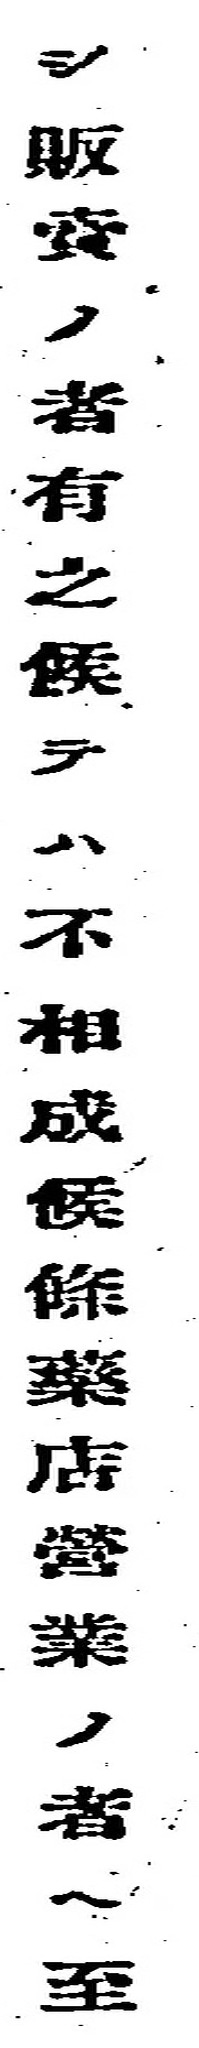シ販売ノ者有之候テハ不相成候条薬店営業ノ者ヘ至
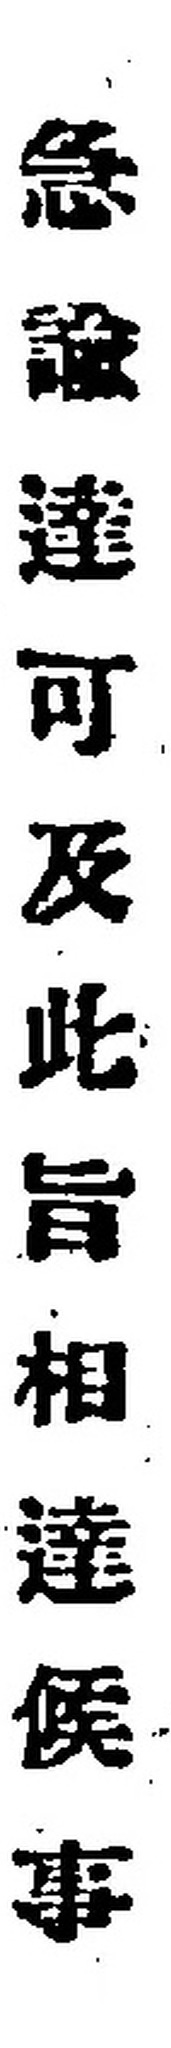急諭達可及此旨相達候事
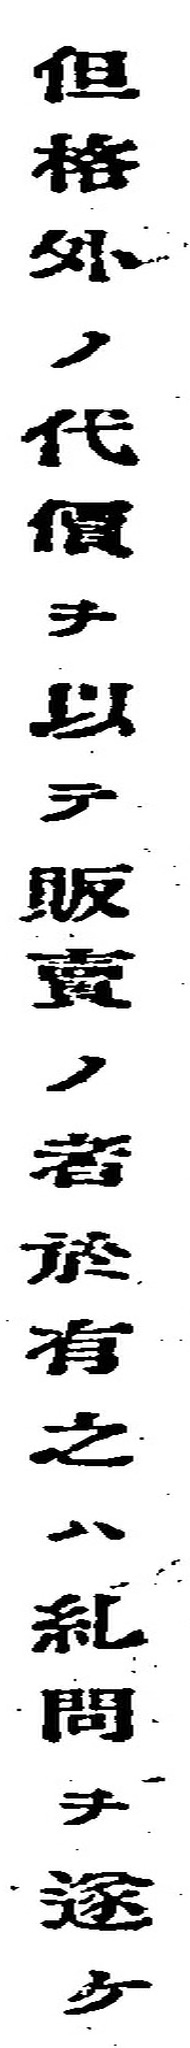但格外ノ代価ヲ以テ販売ノ者於有之ハ糺問ヲ遂ケ
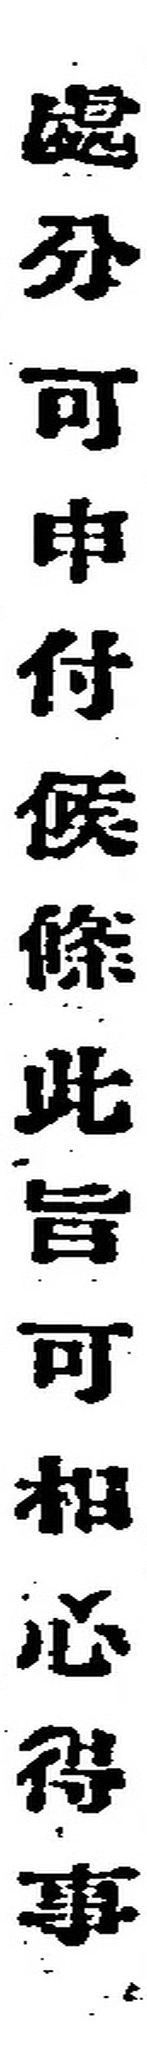処分可申付候条此旨可相心得事
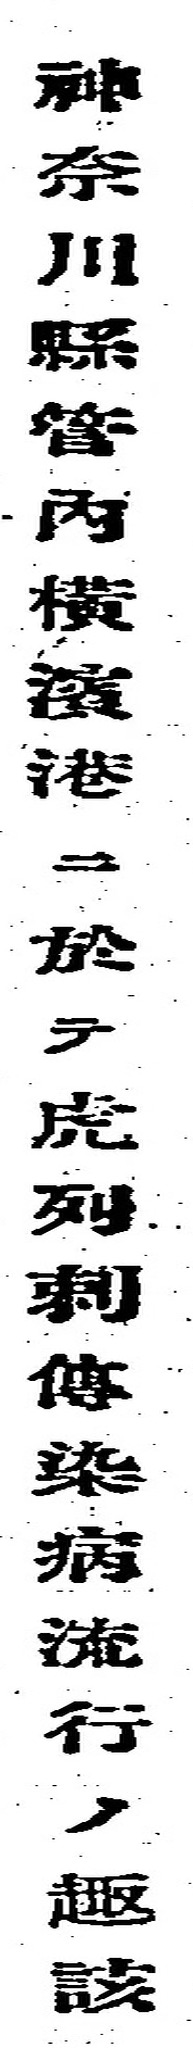神奈川県管内横浜港ニ於テ虎列刺伝染病流行ノ趣該
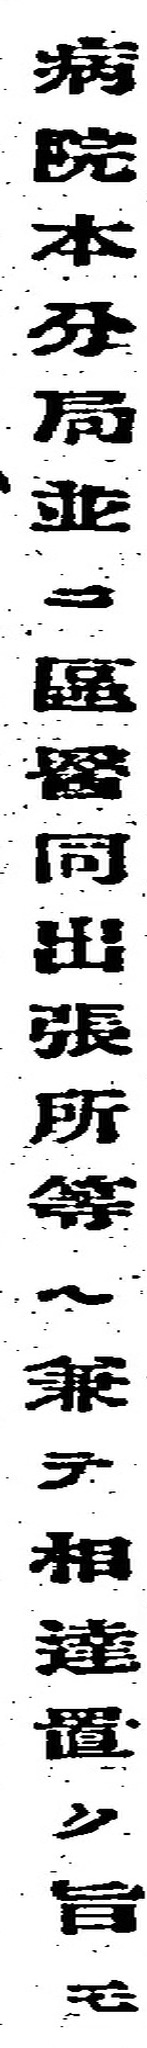病院本分局並ニ区医同出張所等へ兼テ相達置ク旨モ
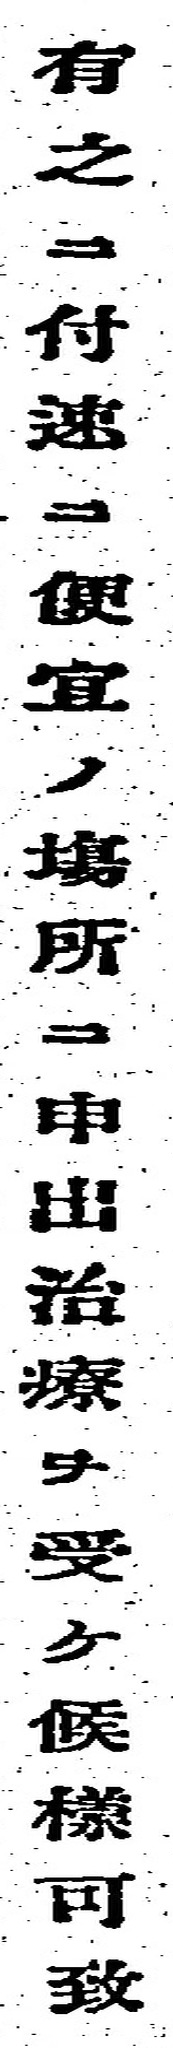有之ニ付速ニ便宜ノ場所ニ申出治療ヲ受ケ候様可致
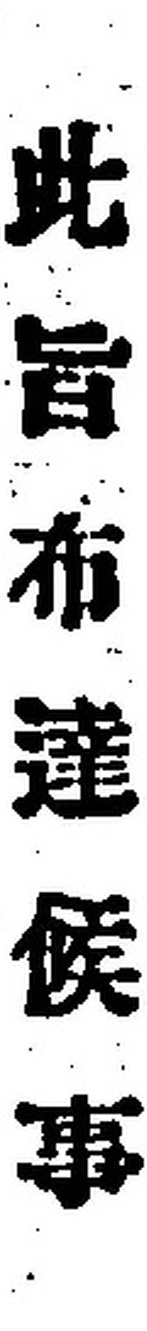此旨布達候事
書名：これら病予防心得
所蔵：国立国会図書館 National Diet Library, JAPAN
